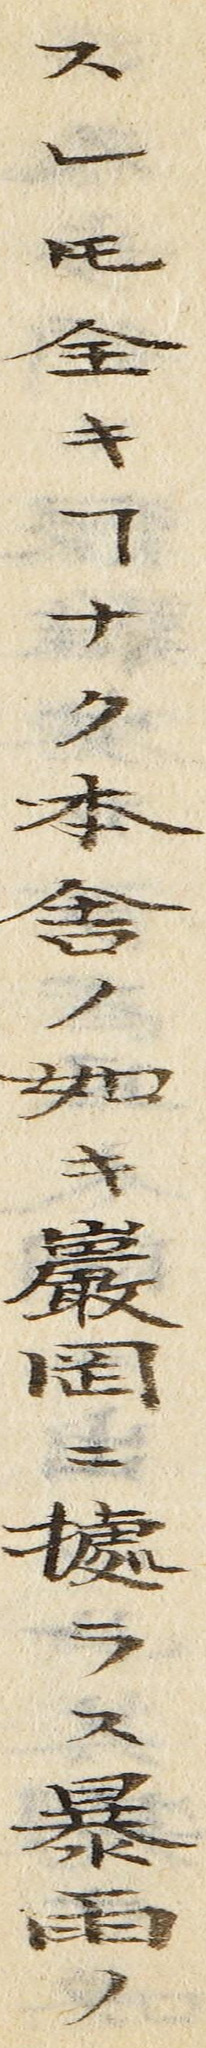スレトモ全キコトナク本舎ノ如キ巌岡ニ拠ラス暴雨ノ
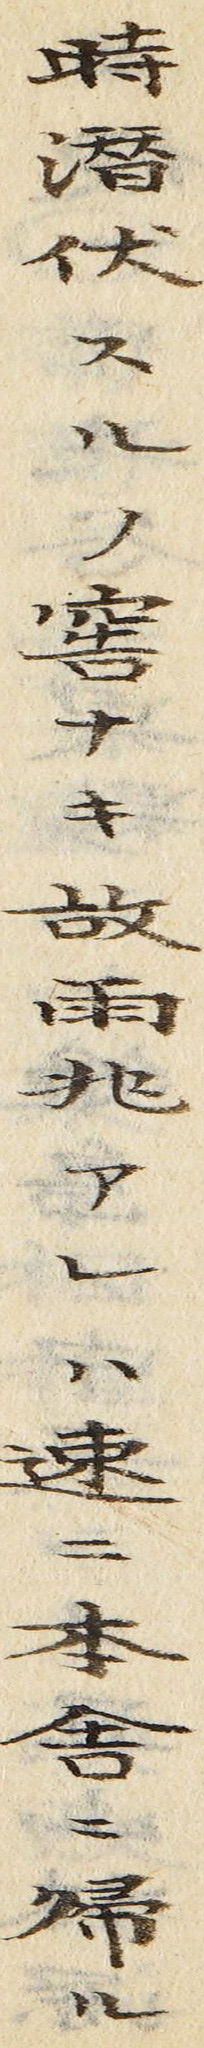時潜伏スルノ窖ナキ故雨兆アレハ速ニ本舎ニ帰ル
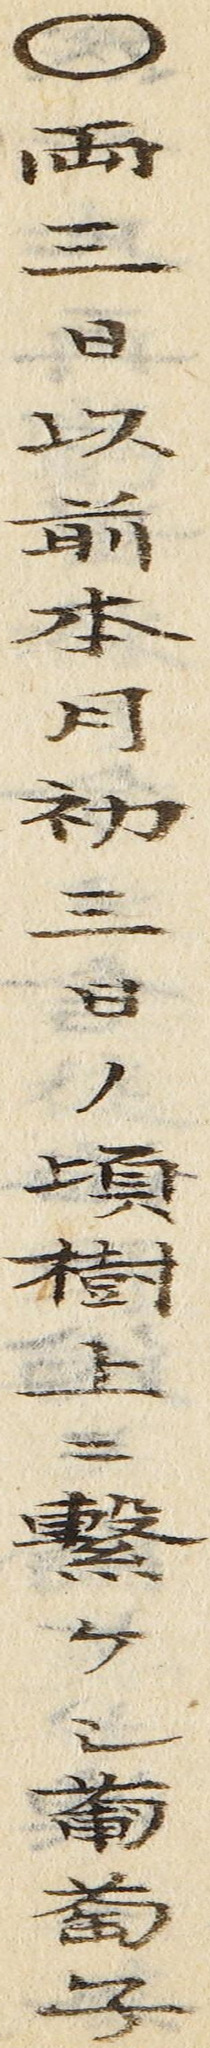◯両三日以前本月初三日ノ頃樹上ニ繋ケシ葡萄子
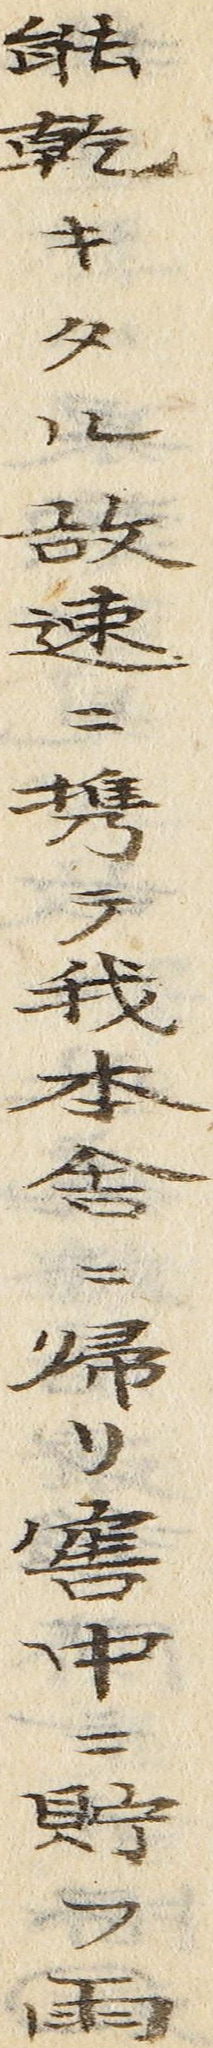能乾キタル故速ニ携テ我本舎ニ帰リ窖中ニ貯フ雨
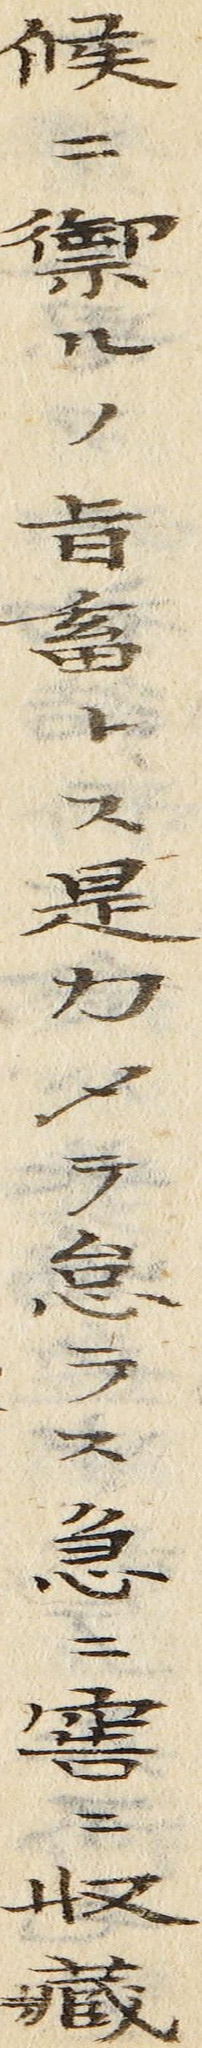候ニ禦ルノ旨畜トス是力シメテ怠ラス急ニ窖ニ収蔵
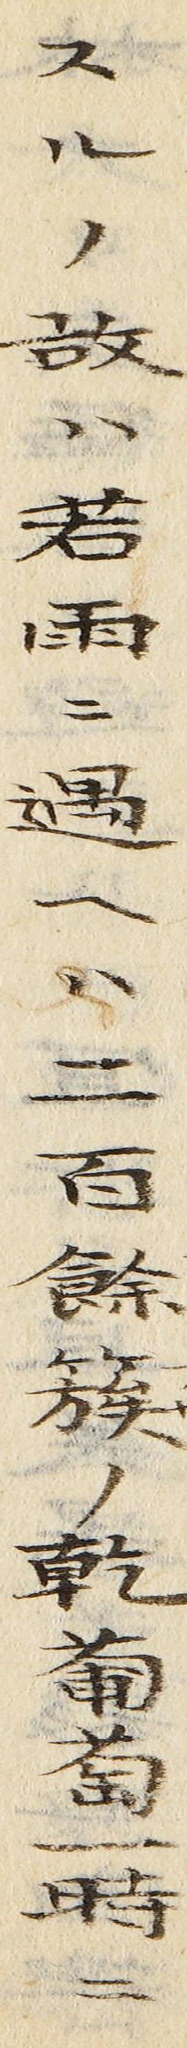スルノ故ハ若雨ニ遇ヘハ二百余簇ノ乾葡萄一時ニ
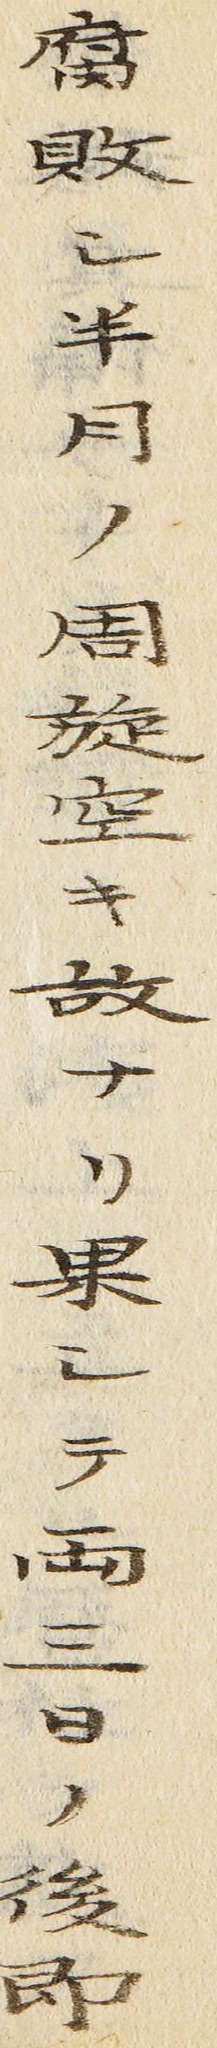腐敗シ半月ノ周旋空キ故ナリ果シテ両三日ノ後即
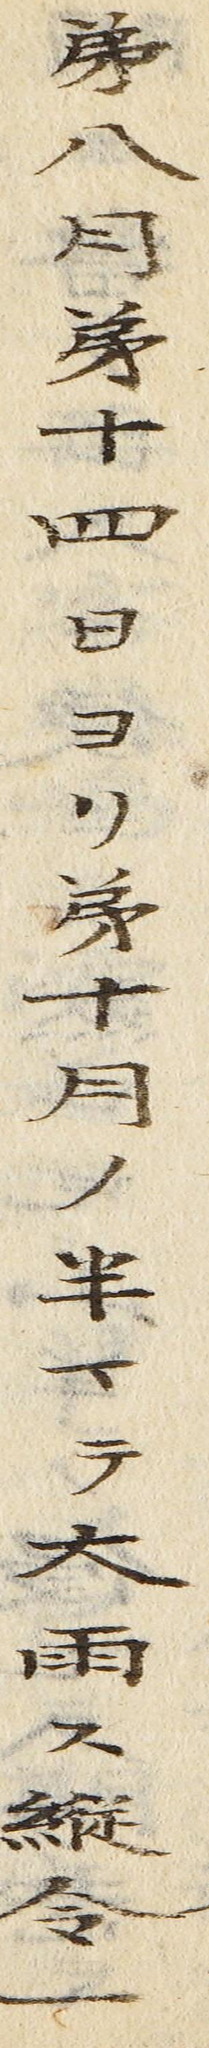第八月第十四日ヨリ第十月ノ半マテ大雨ス縦令一
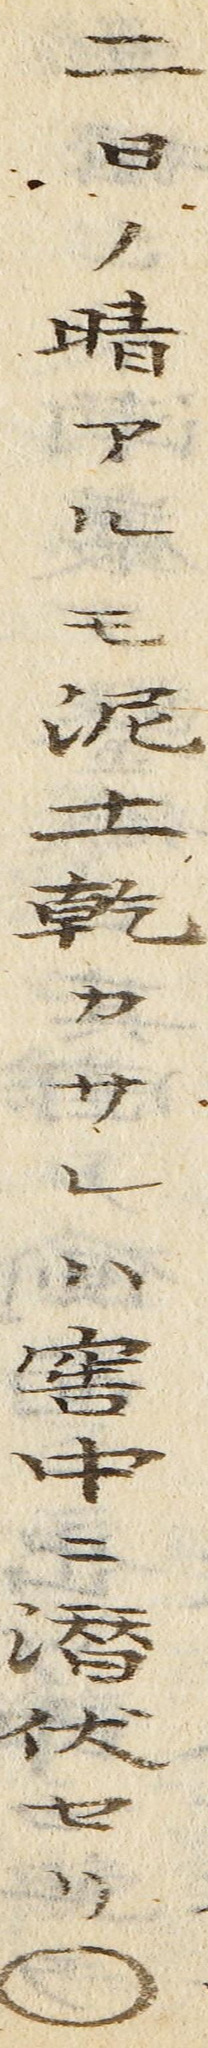二日ノ晴アルモ泥土乾カサレハ窖中ニ潜伏セリ◯
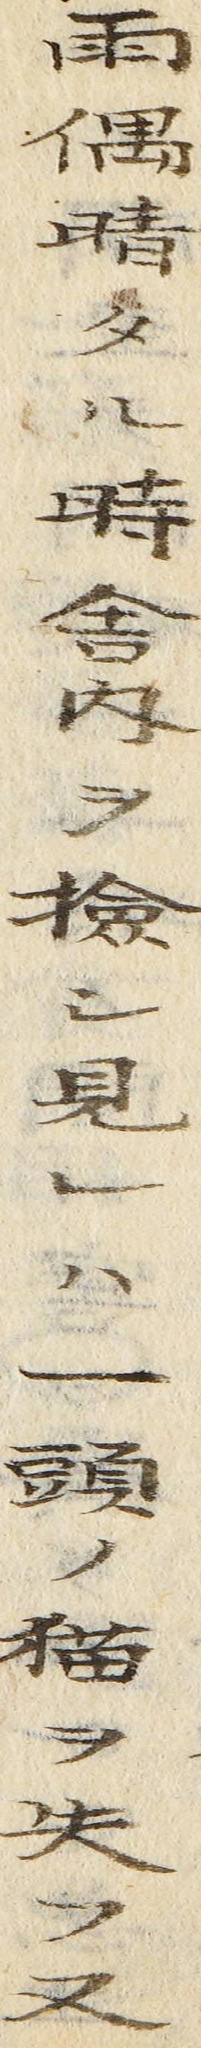雨偶晴タル時舎内ヲ撿シ見レハ一頭ノ猫ヲ失フ又
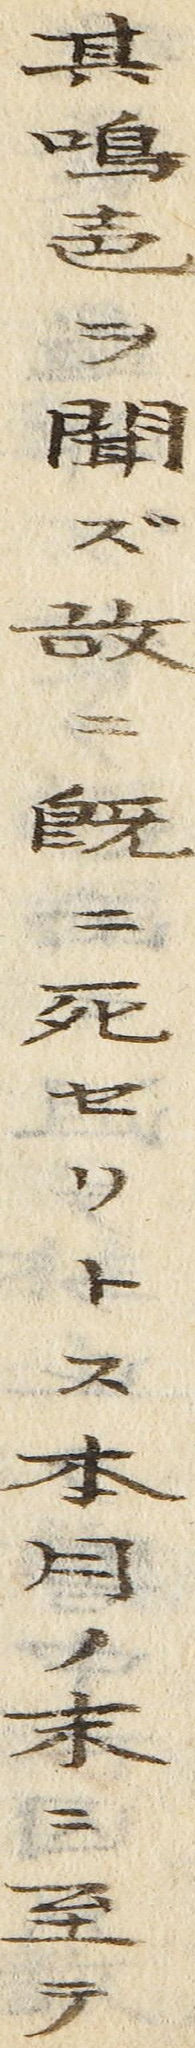其鳴声ヲ聞ズ故ニ既ニ死セリトス本月ノ末ニ至テ
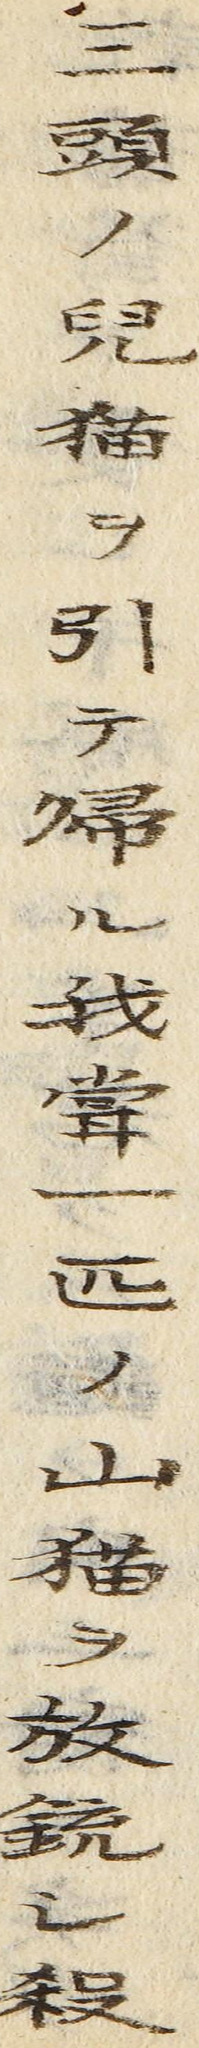三頭ノ児猫ヲ引テ帰ル我嘗一匹ノ山猫ヲ放銃シ殺
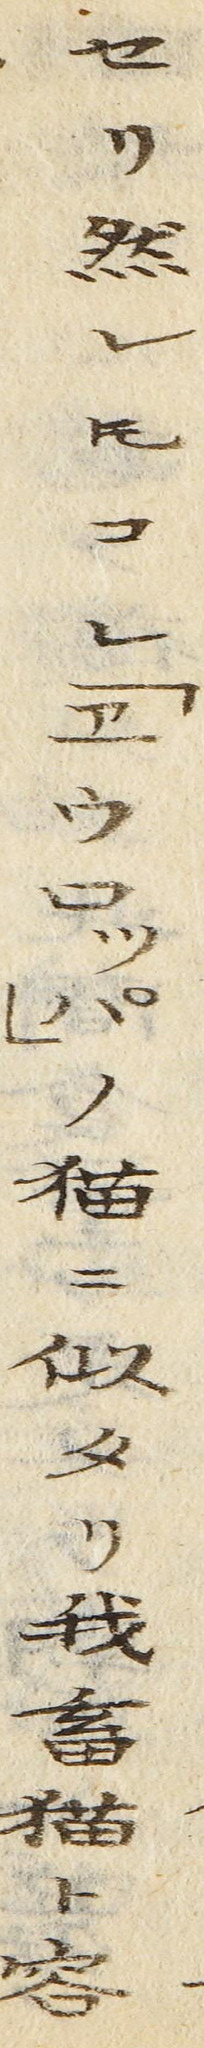セリ然レトモコレ「ヱウロツパ」ノ猫ニ似タリ我畜猫ト容
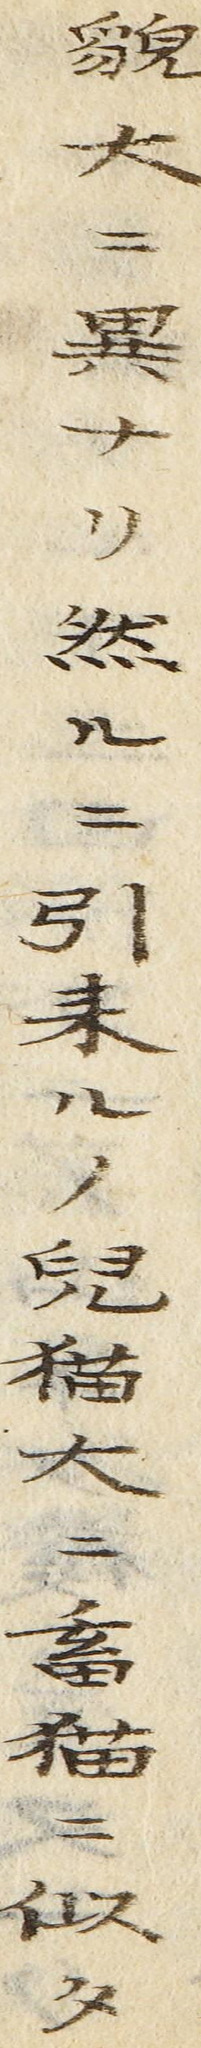貌大ニ異ナリ然ルニ引来ルノ児猫大ニ畜猫ニ似タ
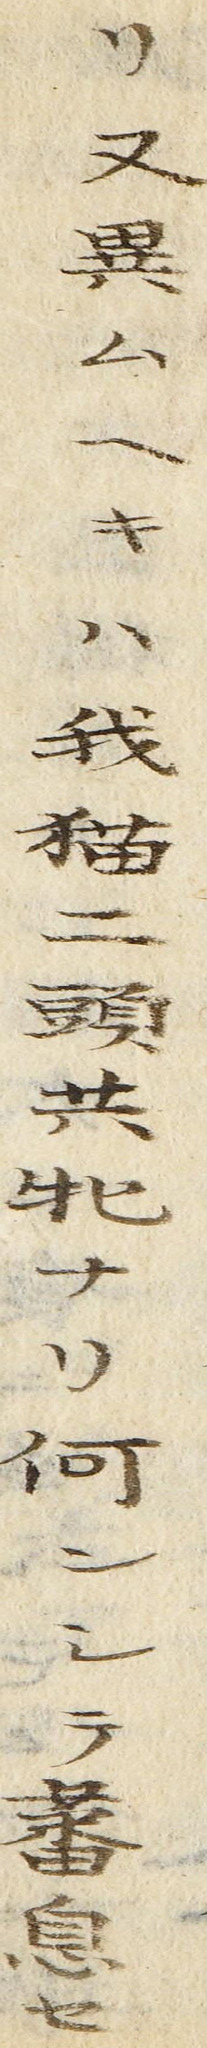リ又異ムヘキハ我猫二頭共牡ナリ何ンシテ蕃息セ
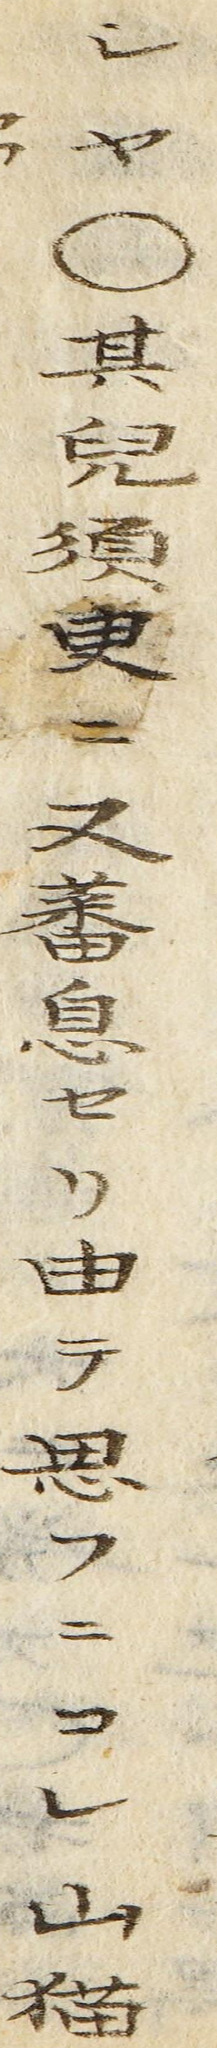シヤ◯其児須更ニ又蕃息セリ由テ思フニコレ山猫
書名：漂流紀事
